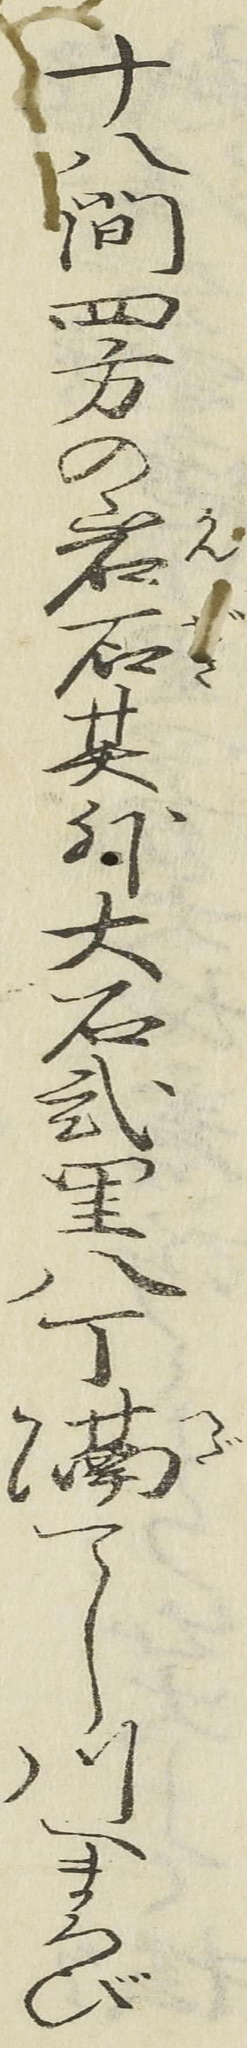十八間四方の岩石其外大石弐里八丁隔てし川へまろび
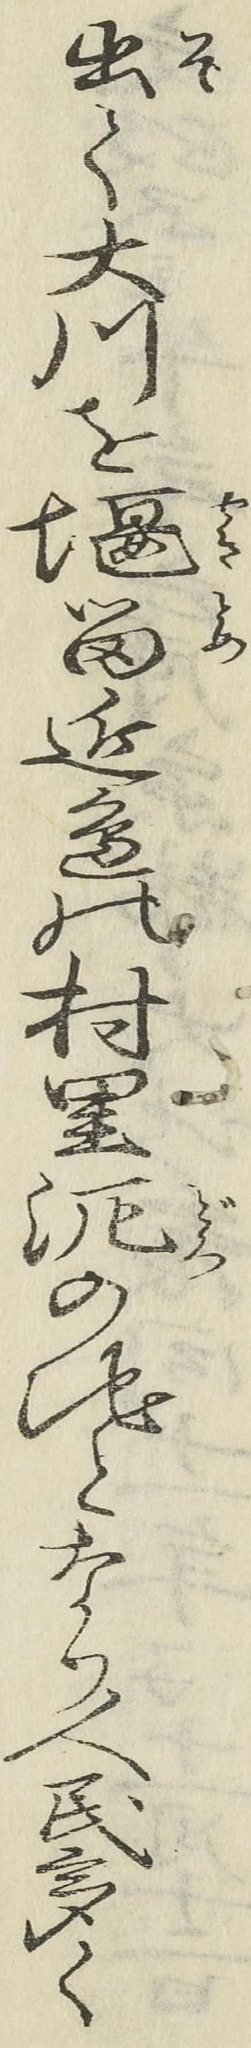出て大川を堰留近辺の村里泥の地となり人民多く
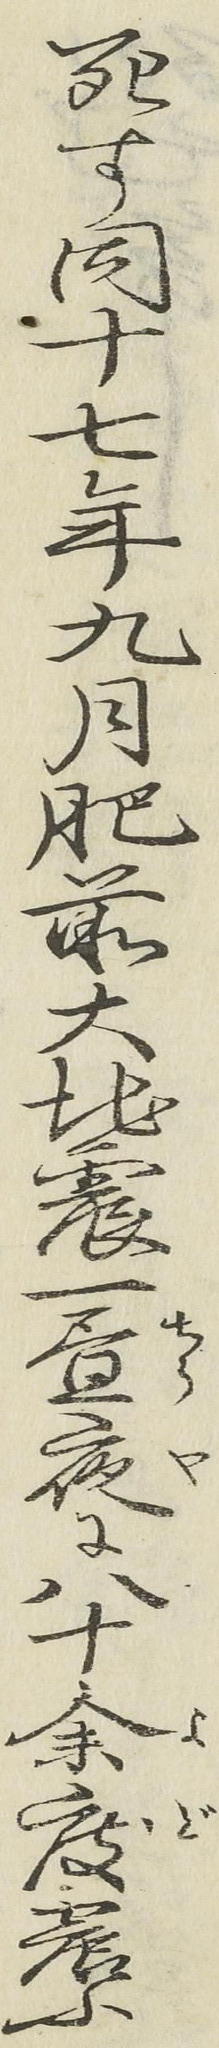死す同十七年九月肥前大地震一昼夜に八十余度震ふ
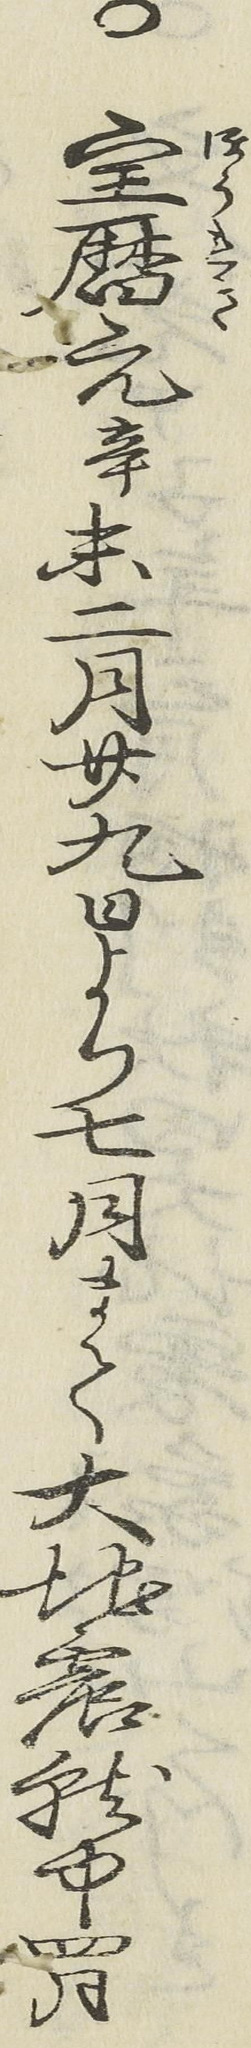〇宝暦元年辛未二月廿九日より七月まて大地震就中四月
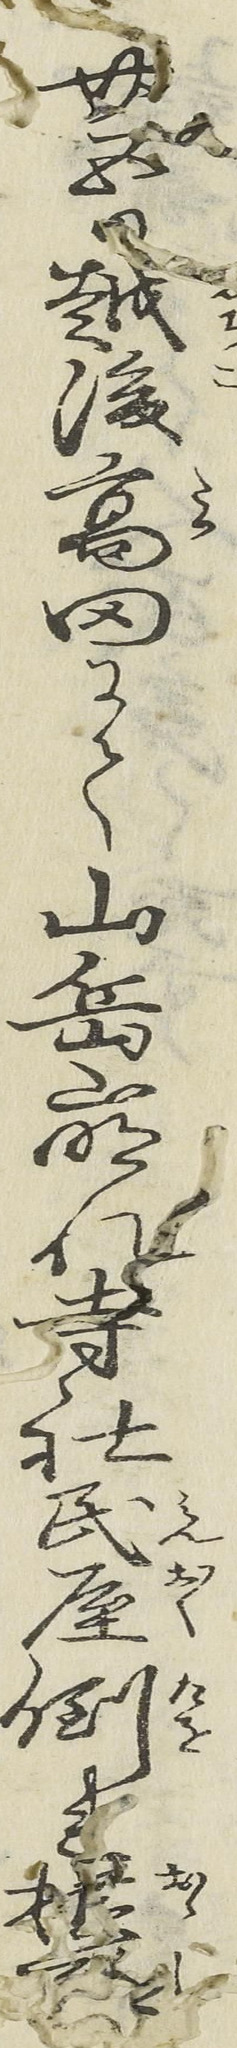廿五日の越後高田にて山岳崩れ寺社民屋倒れ横死
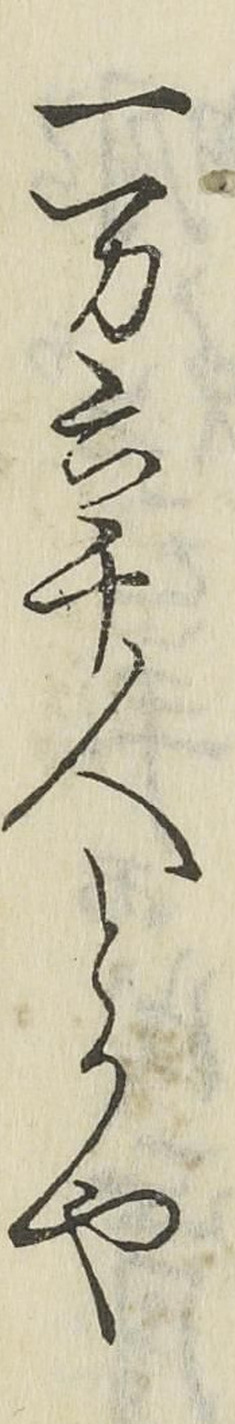一万六千人とかや

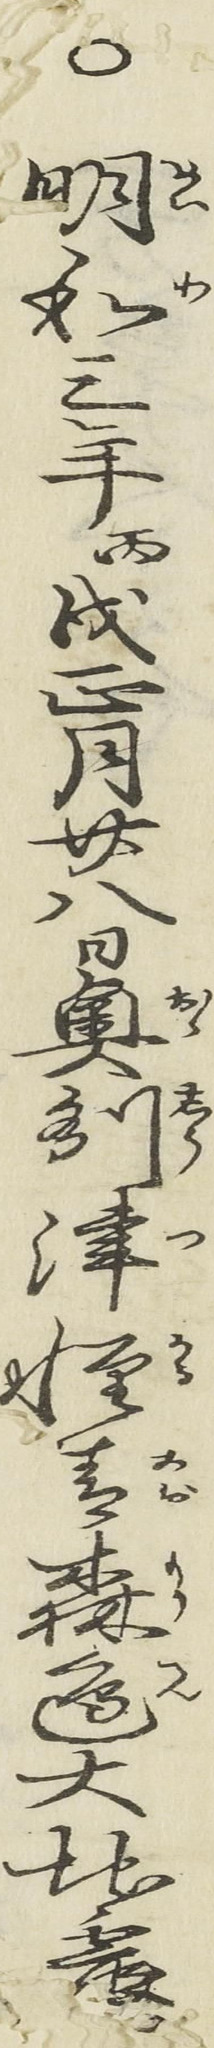〇明和三年丙戌正月廿八日奥州津軽青森邊大地震
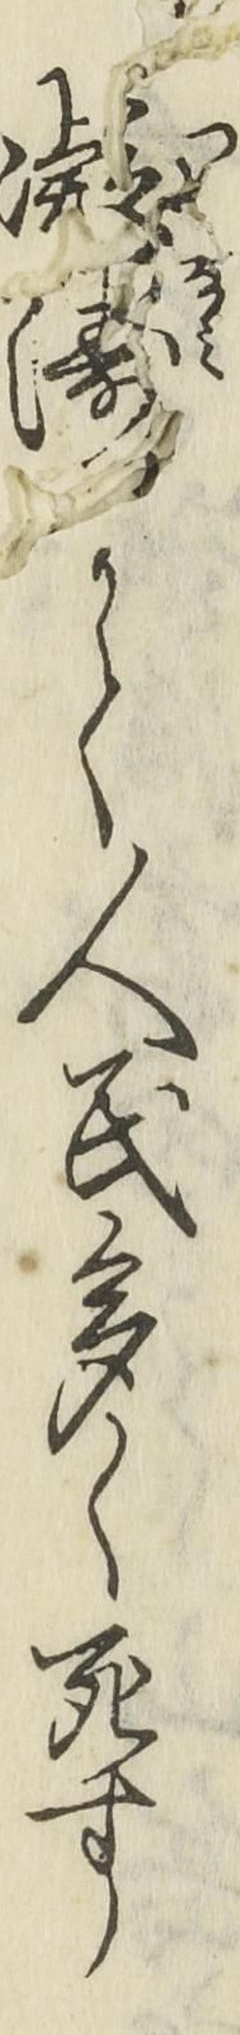凝濤にて人民多く死す
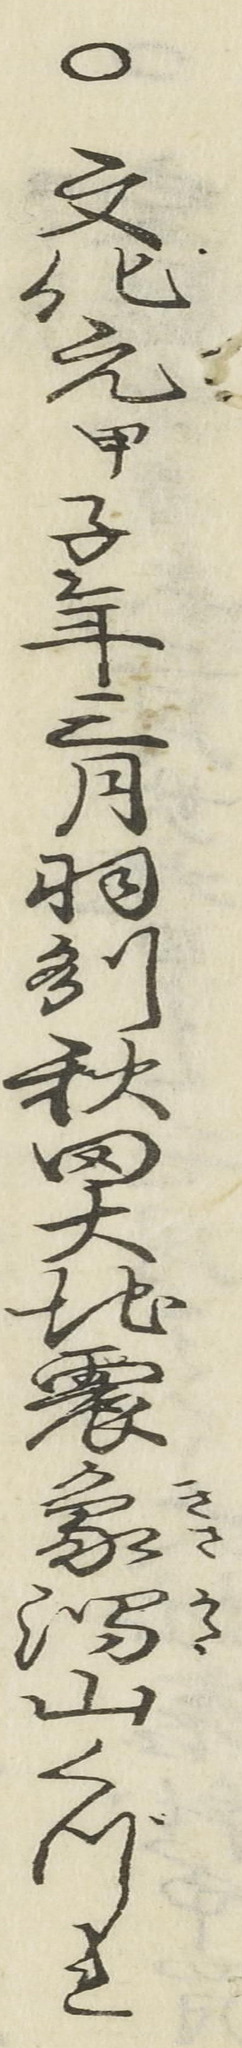〇文化元甲子年三月羽州秋田大地震象潟山くつれ
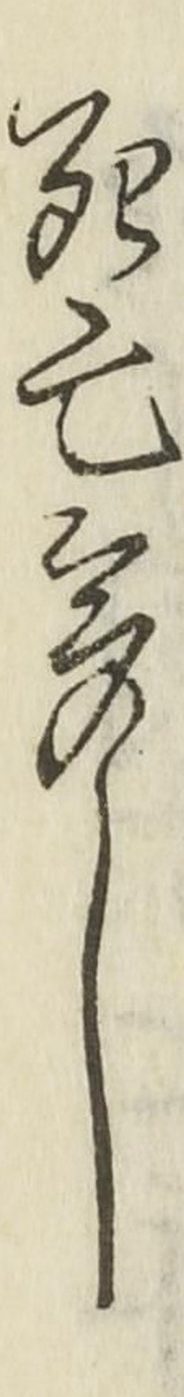死亡多し
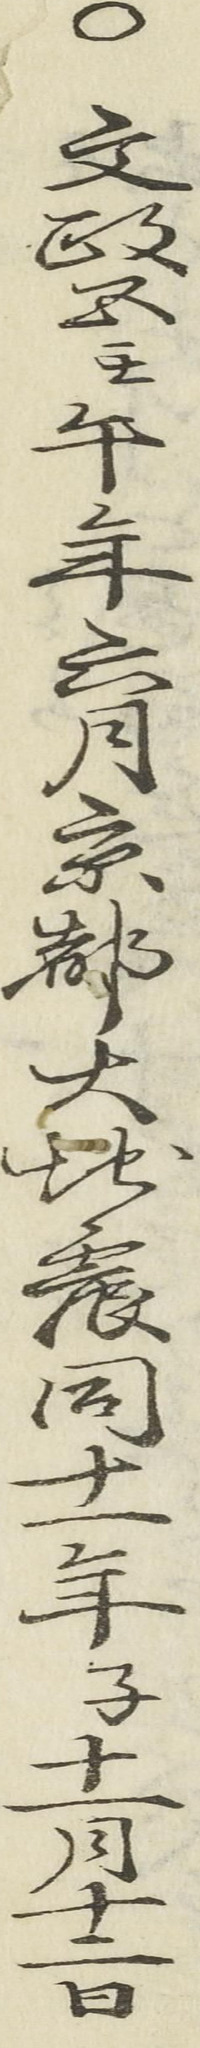〇文政五壬午年六月京都大地震同十一年子十一月十二日
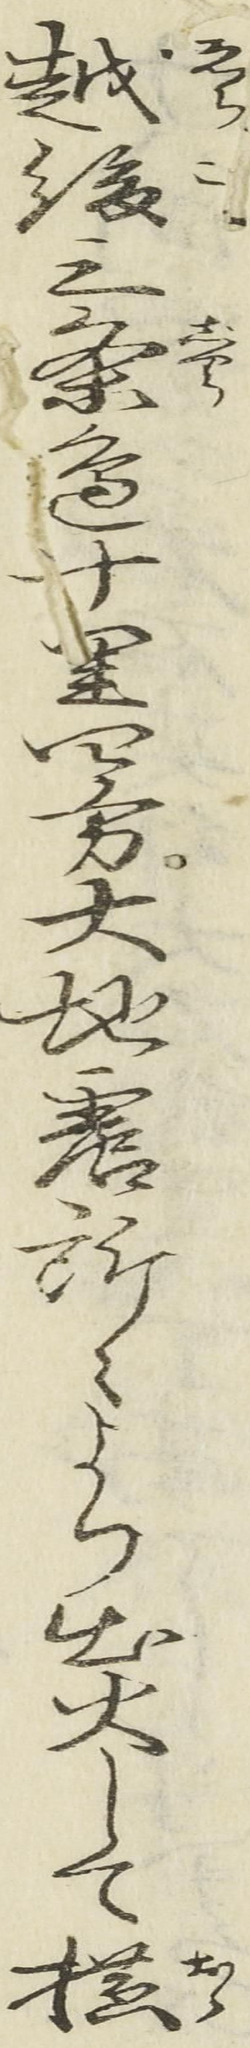越後三条邊十里四方大地震処々より出火して横’
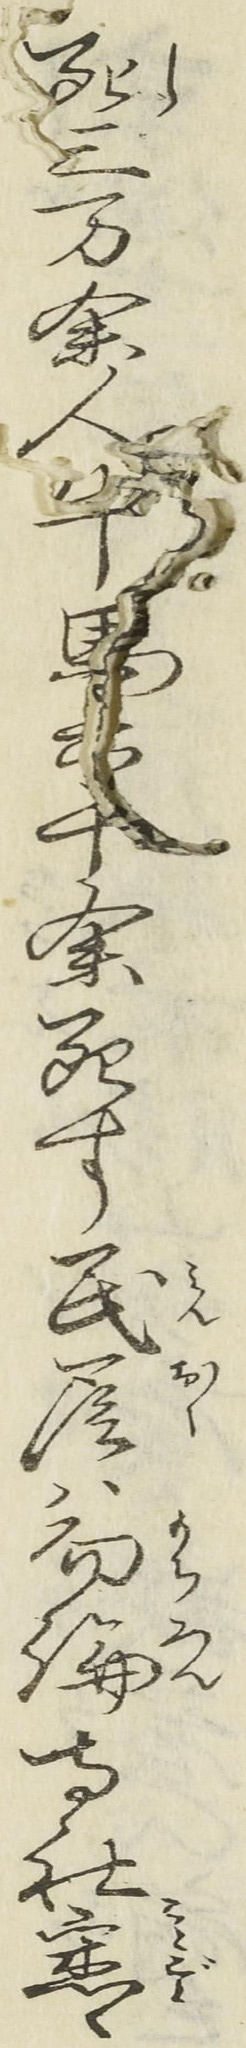死三万余人牛馬六千余死す民屋は勿論寺社悉く
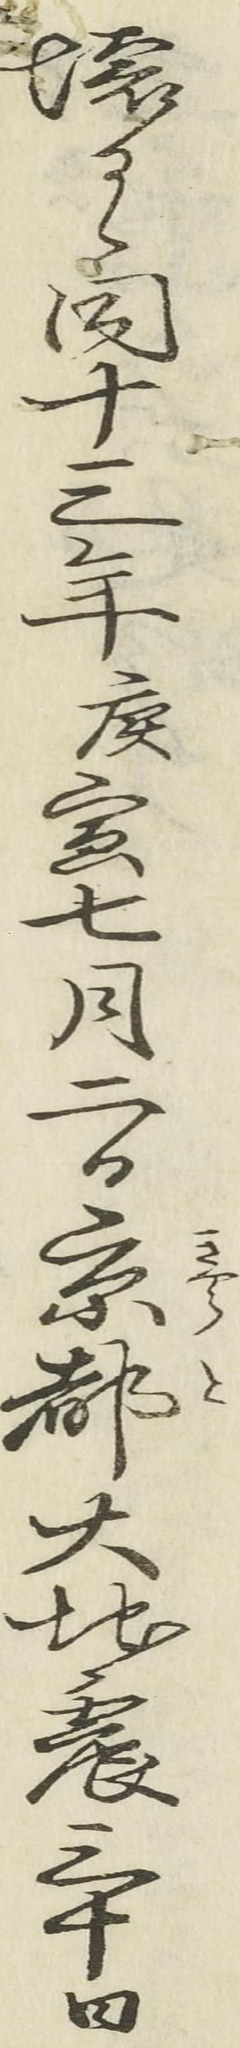壊るゝ同十三年庚寅七月二日京都大地震三十日
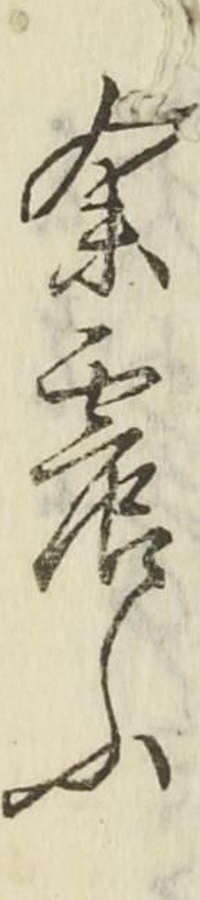余震ふ
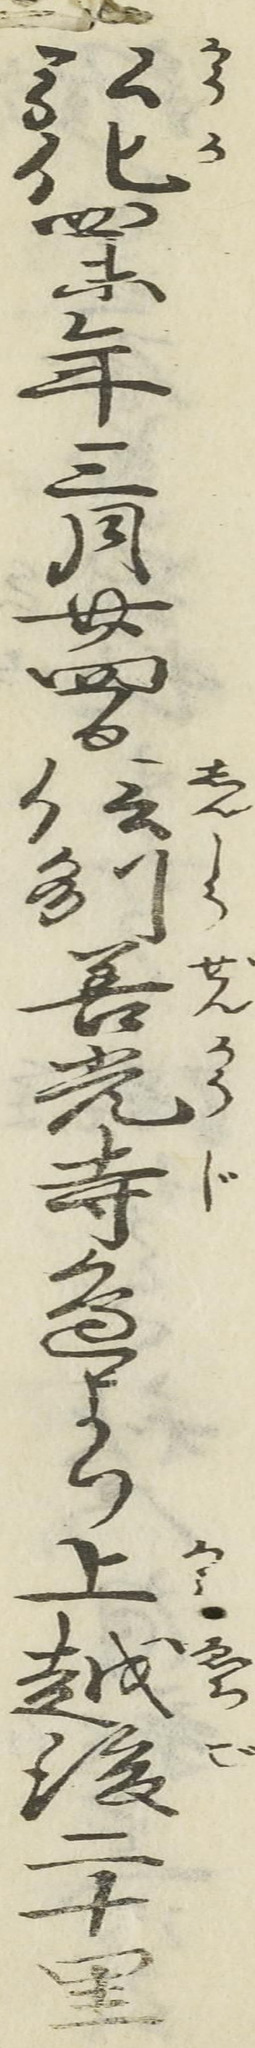〇弘化四未年三月廿四日信州善光寺邊より上越後二十里
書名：震雷考説　全
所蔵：東京大学地震研究所図書室 Earthquake Research Institute Library, The University of Tokyo, JAPAN
